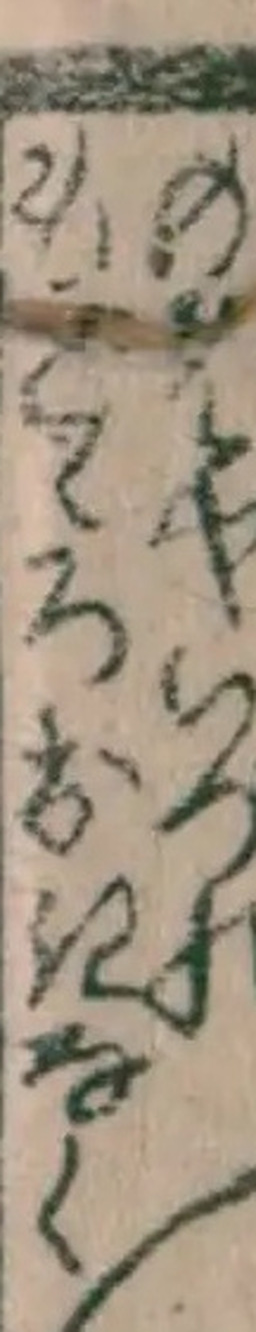もこゝろおきなく
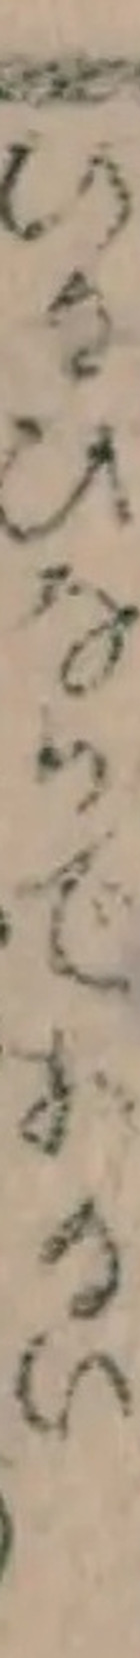ひるひなかであるい
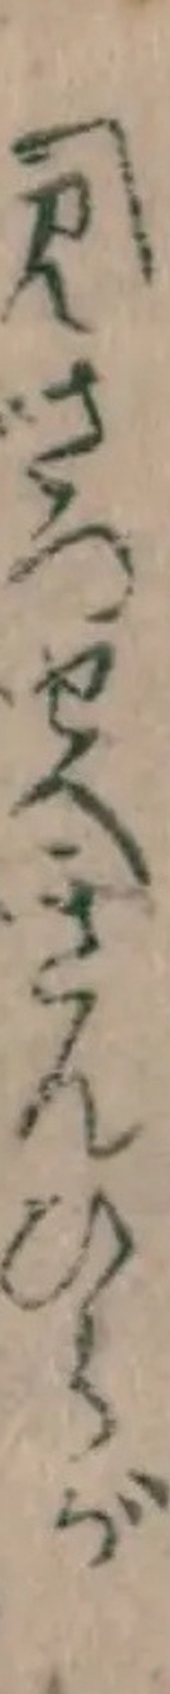〽見さつせへきんひらが
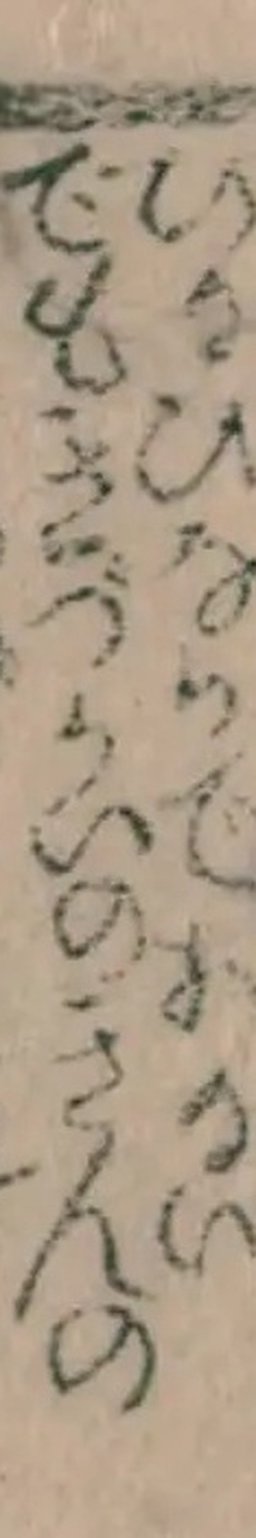でもきづかいのきんの
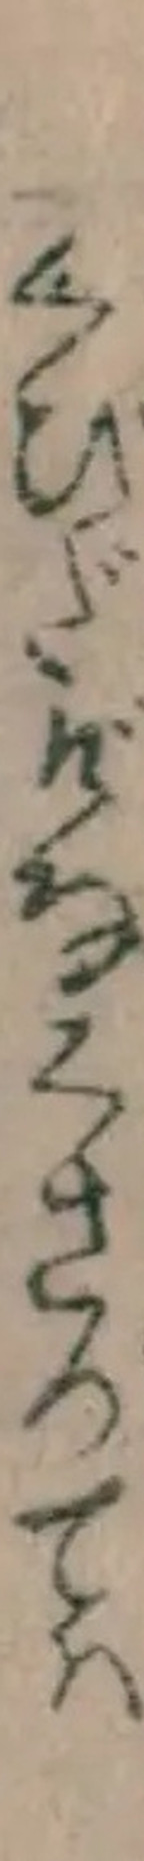くびだげなくさつては
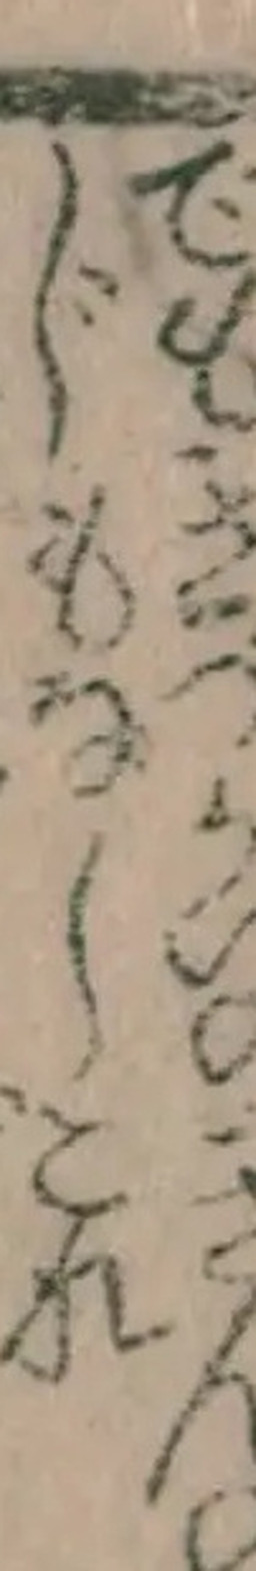じもなしこれ
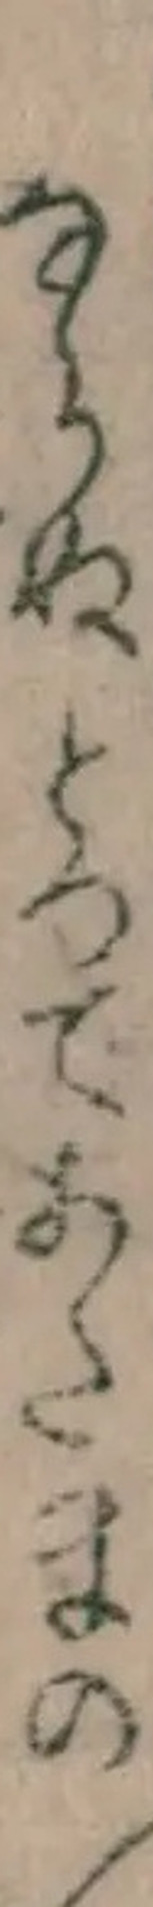ならぬとつてあたまの
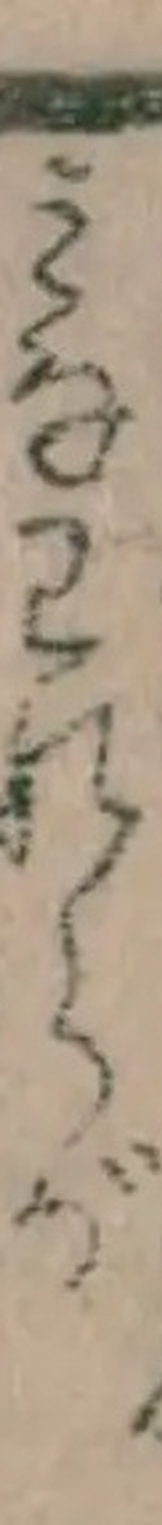みなわれらが
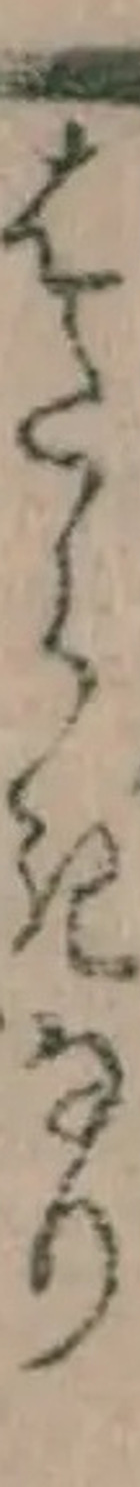はたらきなり
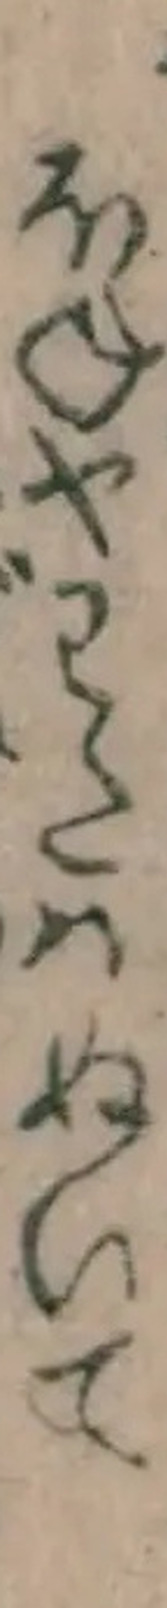ほねやわたはぬいて
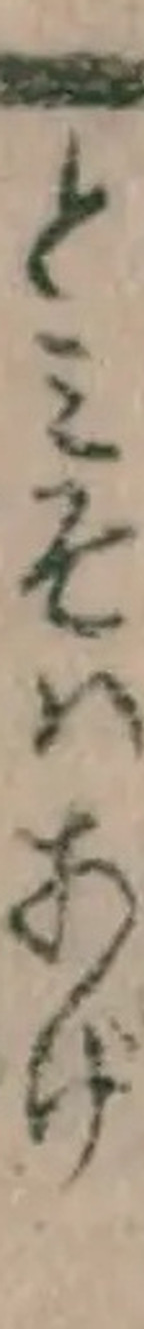とみそはあげ
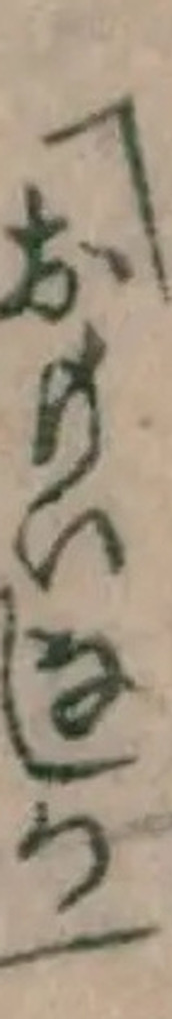〽おもいなしか
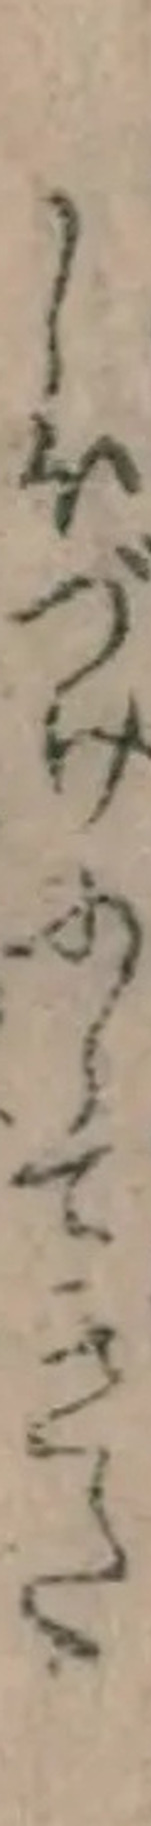しほづけにしてきた
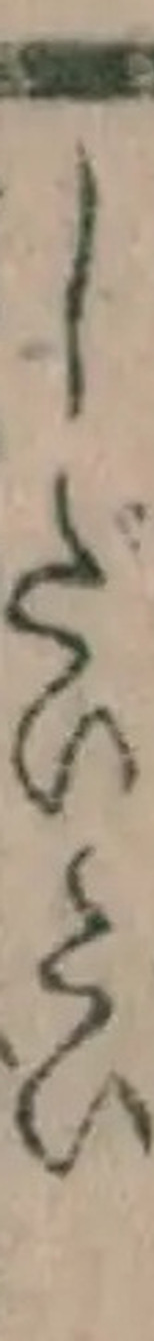しだいたい
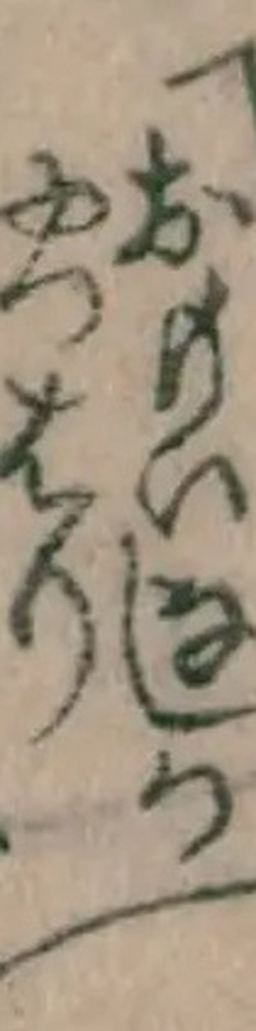やつはり
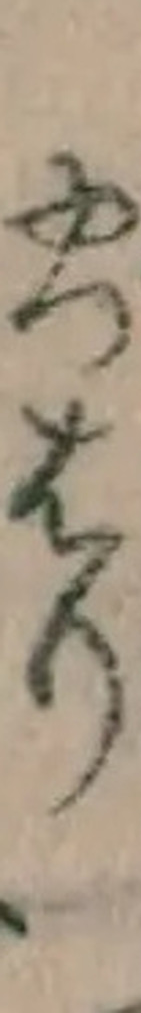やつはり
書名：信有奇怪会
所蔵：国立国会図書館 National Diet Library, JAPAN
